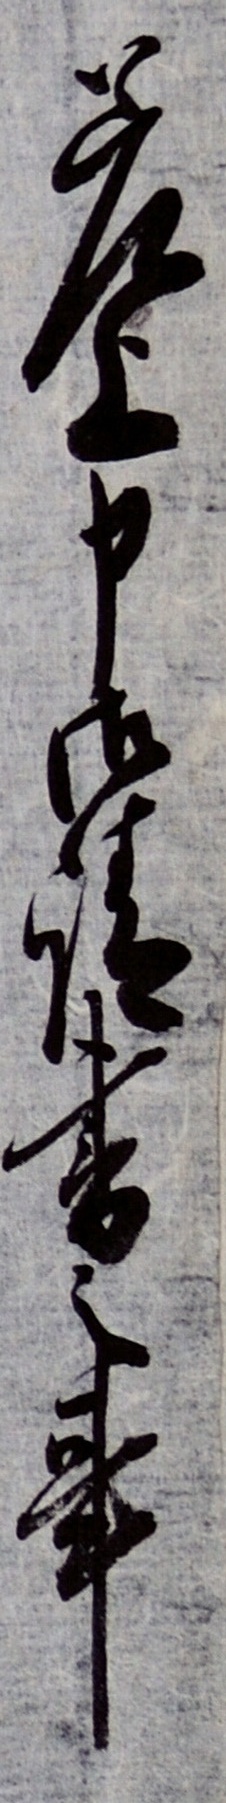差上申御請書之事
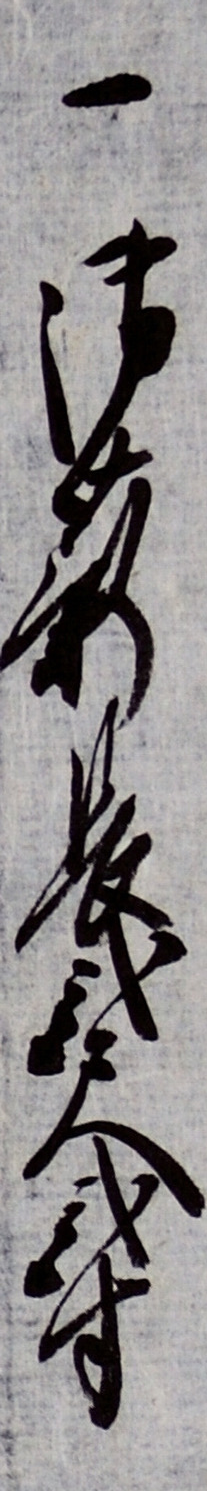一御薪長弐尺弍寸
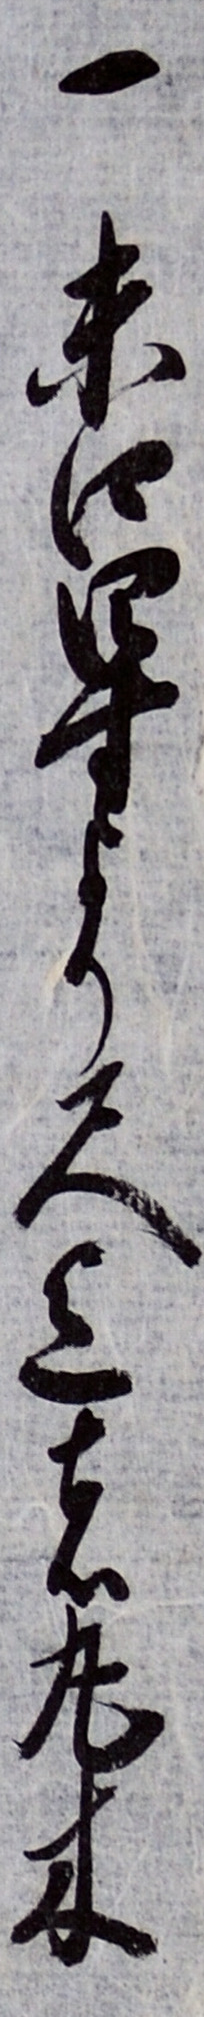一末口四寸より尺迄者丸木
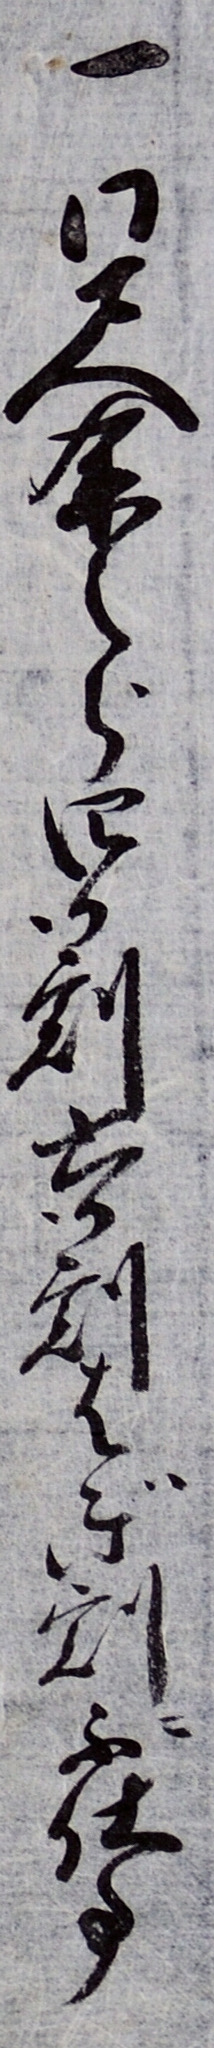一同尺余之分四ツ割、六ツ割、はぎ割ニ不仕事
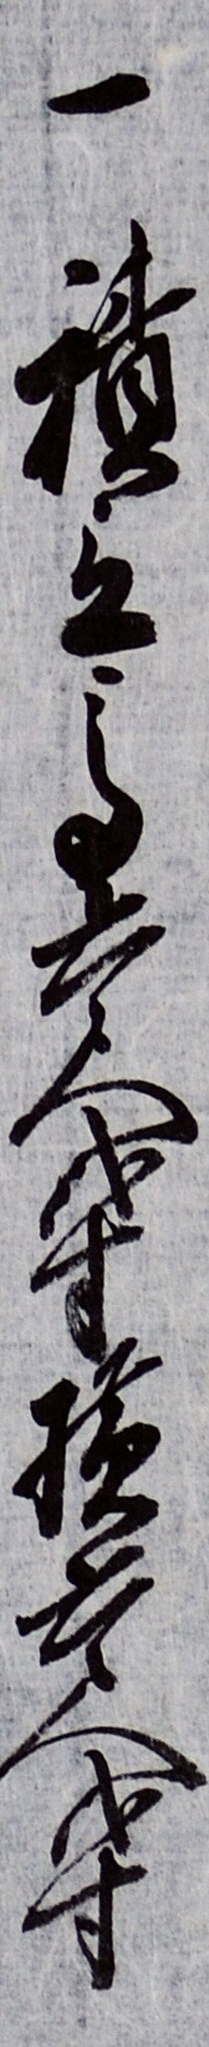一積立高六尺弍寸、横六尺弍寸
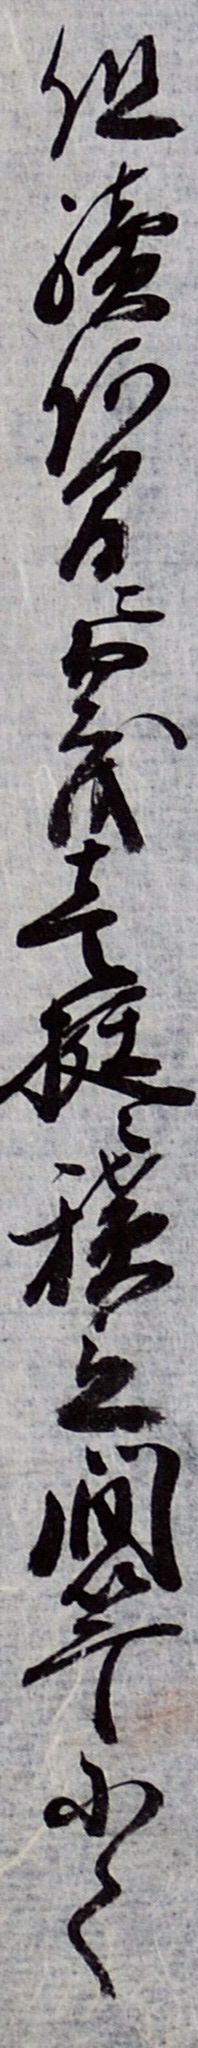但続何間ニ而も壱挺ニ積立間竿にて
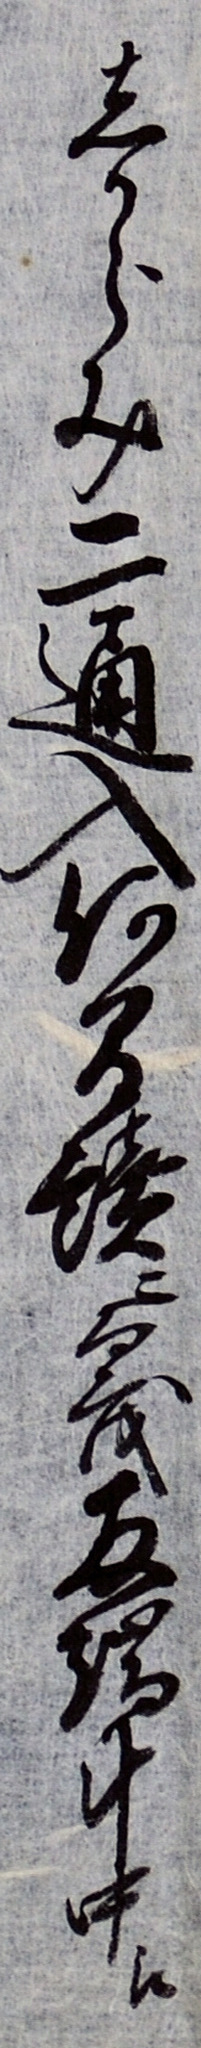しからみ二通入何間続ニ而も両端計中江
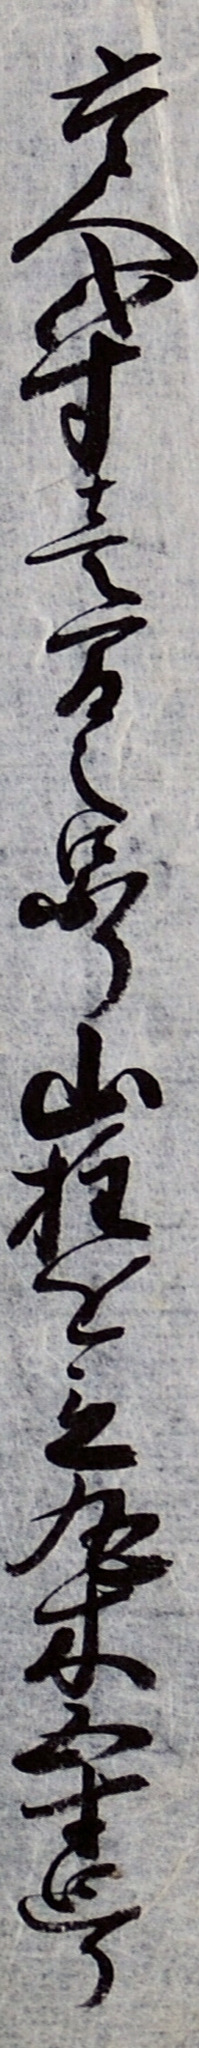六尺弍寸壱間之吊り山柱を立丸木五寸廻り
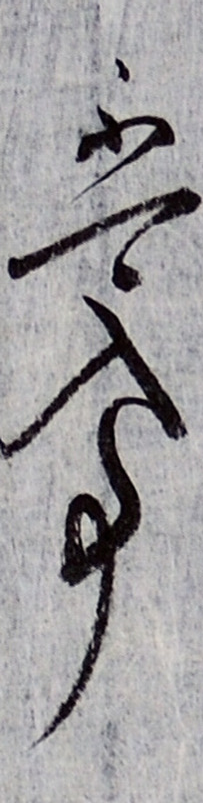不可入事
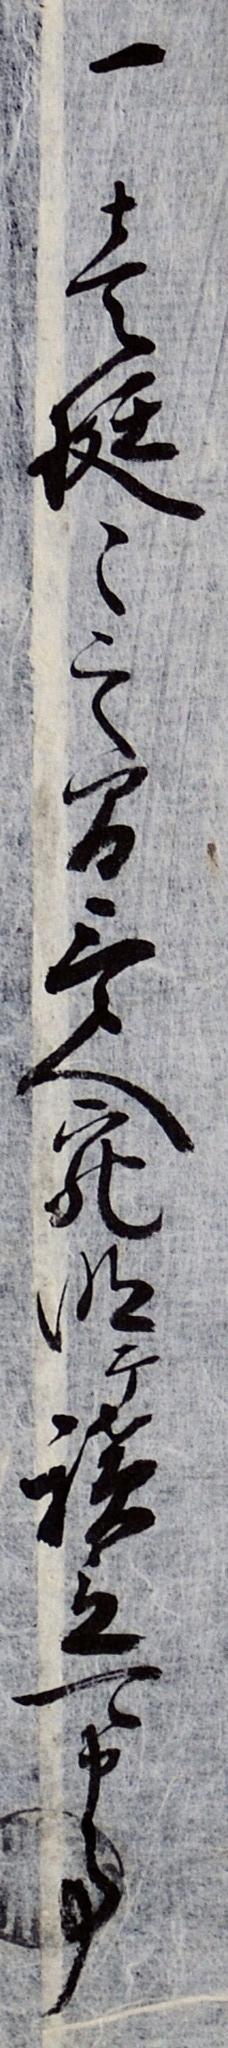一壱挺〱ニて間三尺宛明ケ積立可申事㊞
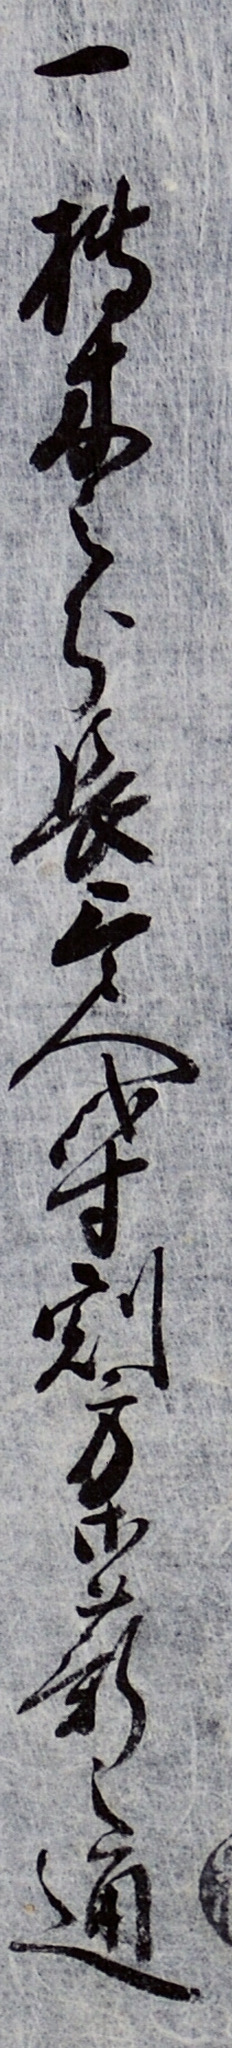一槫木之分長三尺弐寸割方御薪之通
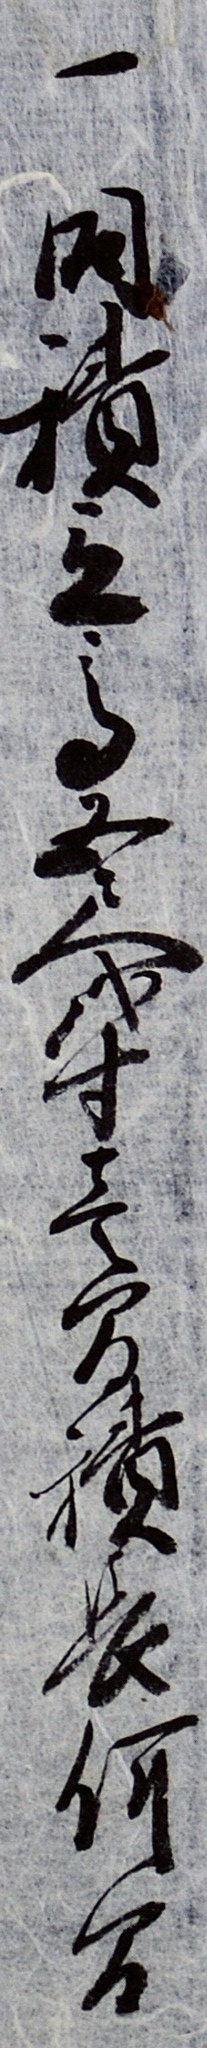一同積立高五尺弐寸壱間積長何間
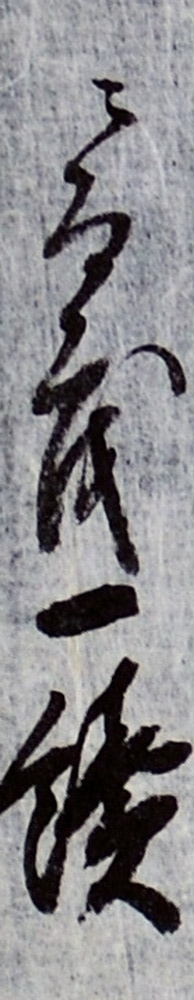ニ而も一続
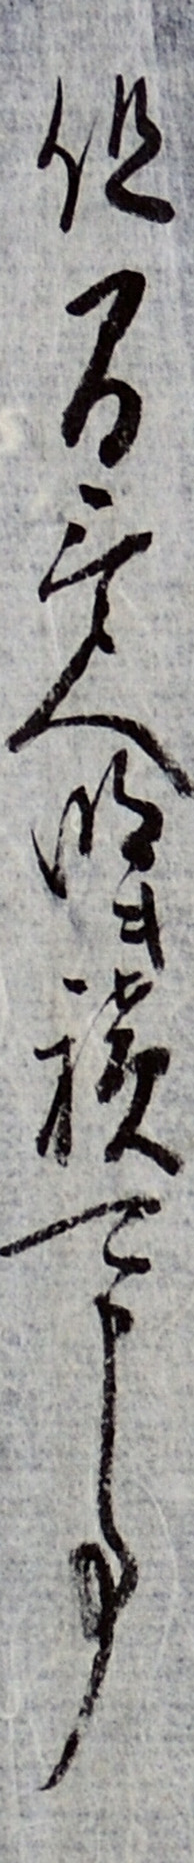但間三尺明キ積可申事
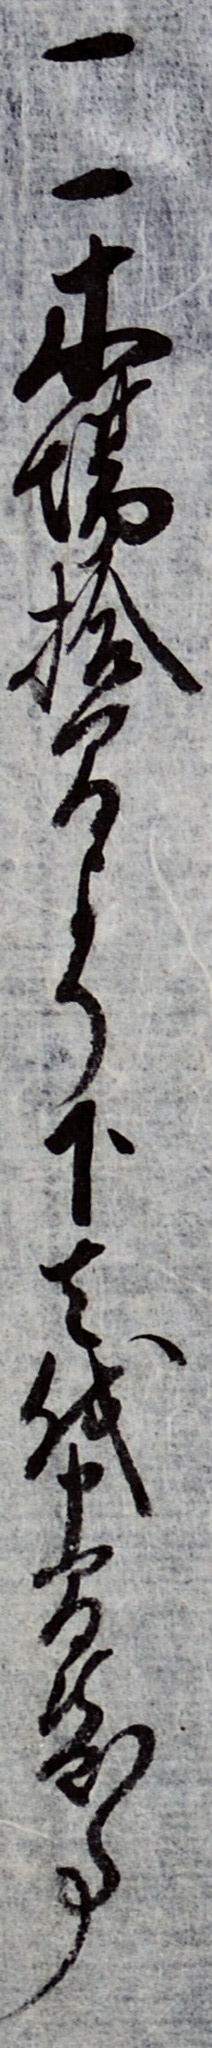一一木場拾間より下者伐申間敷事
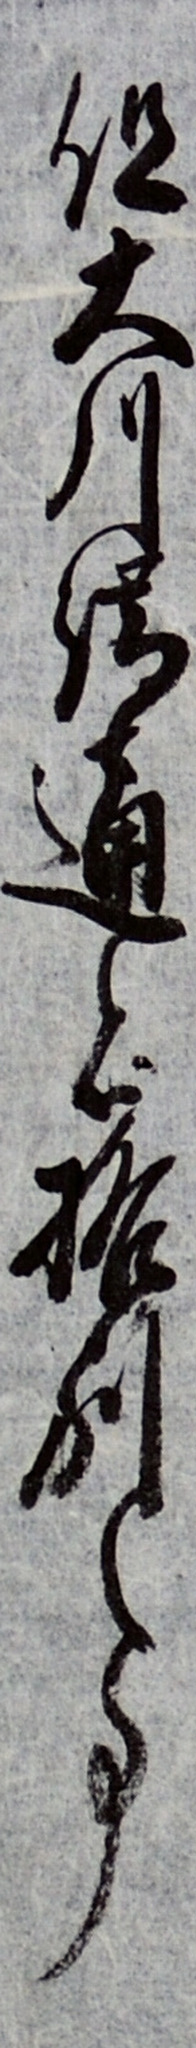但大川御通者格別之事
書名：薪方役所宛諸請書等・一括
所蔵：伊那市立高遠町図書館・合同会社AMANE
